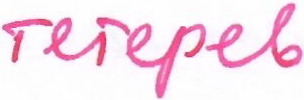тетерев
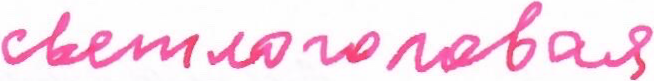светлоголовая
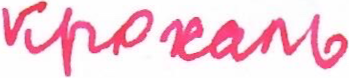крохаль
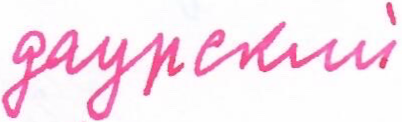даурский
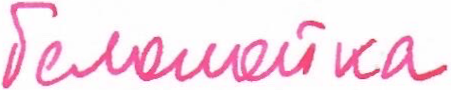белошейка
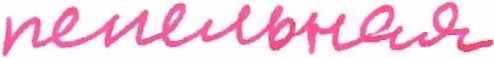пепельная
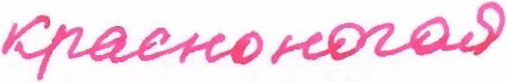красноногая
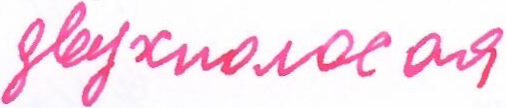двухполосая
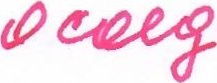осоед
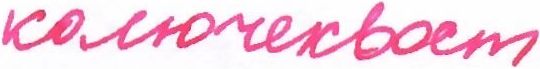колючехвост
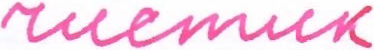чистик
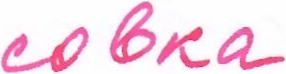совка
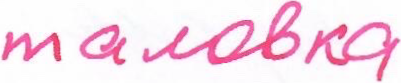таловка
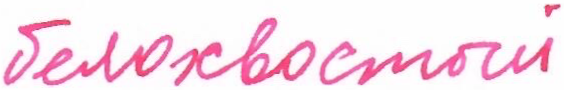белохвостый
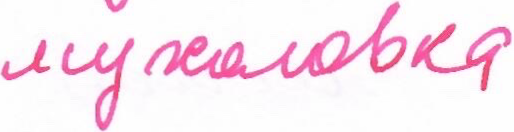мухоловка
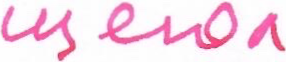щегол
